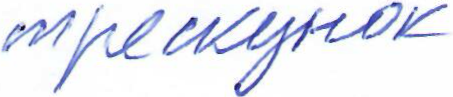трескунок
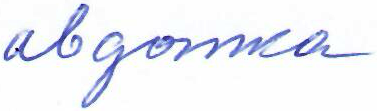авдотка
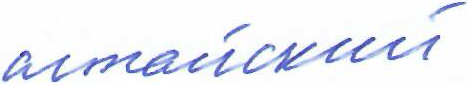алтайский
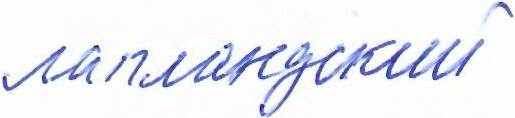лапландский
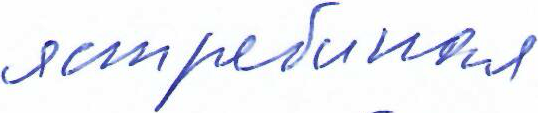ястребиная
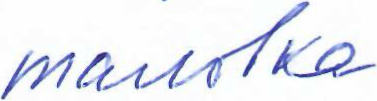таловка
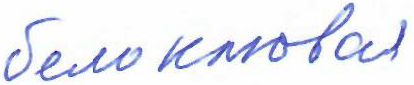бело клювая
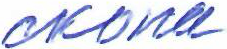скопа
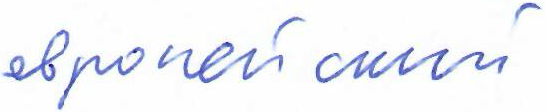европей ский
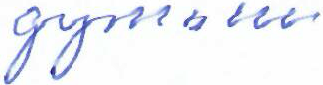дутыш
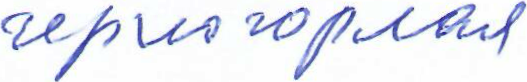черногорлая
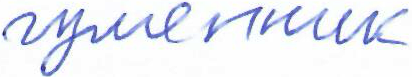гуменник
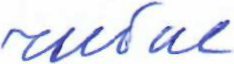чибис
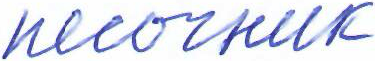песочник
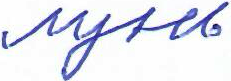лунь
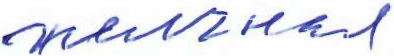желчная
